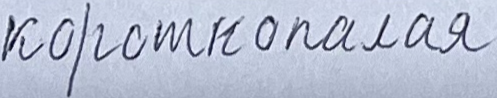короткопалая
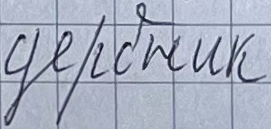дербник
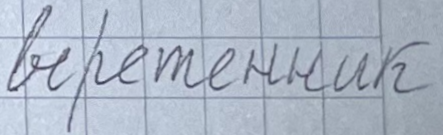веретенник
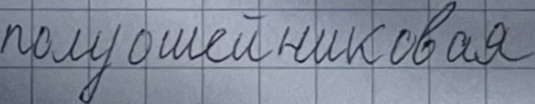полуошейниковая
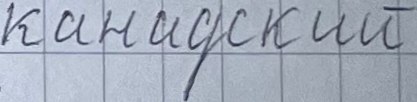канадский
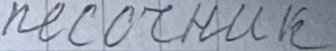песочник
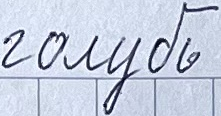голубь
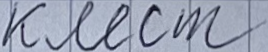клест
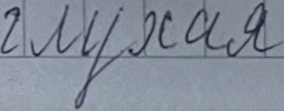глухая
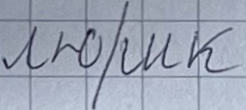люрик
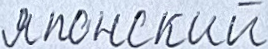японский
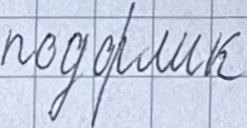подорлик
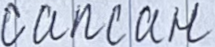сапсан
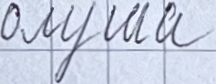олуша
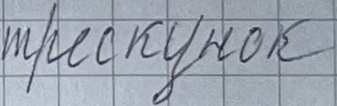трескунок
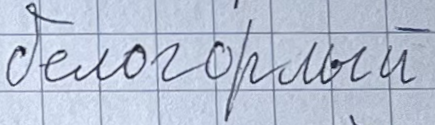белогорлый
